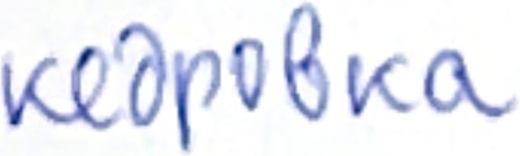кедровка
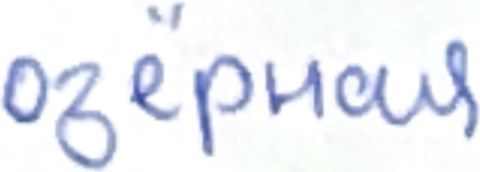озёрная
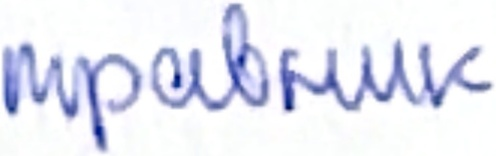травник
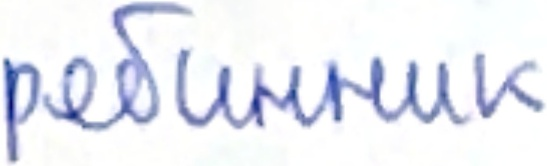ребинник
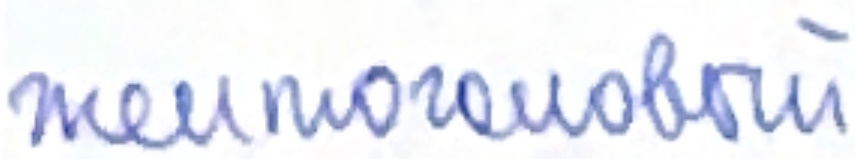желтоголовый
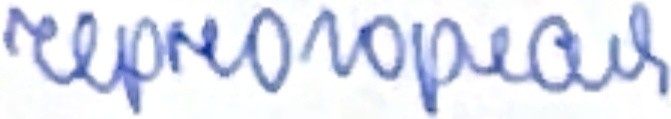черногорлая
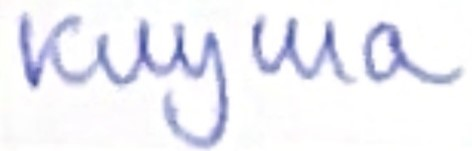клуша
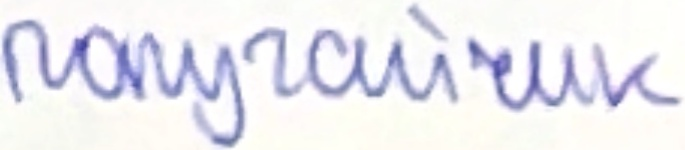попугайчик
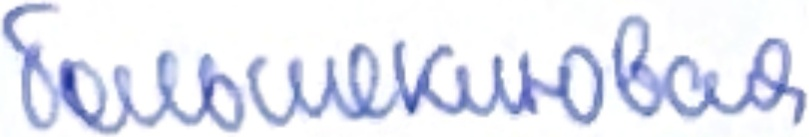большеклювая
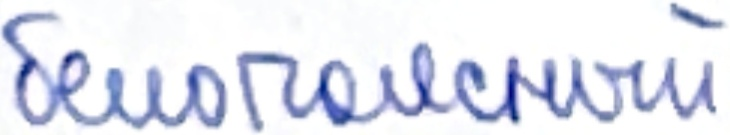белопоясный
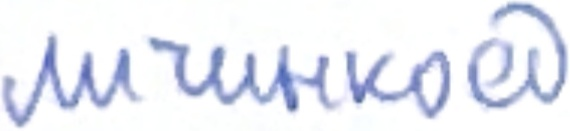личинкоед
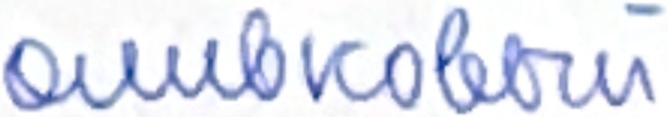оливковый
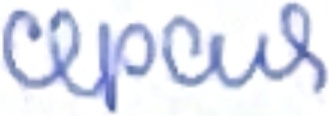серая
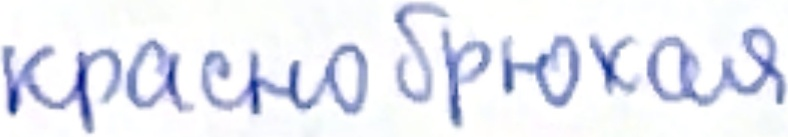красно брюхая
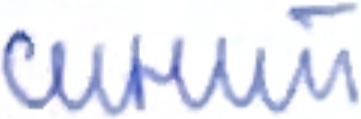синий
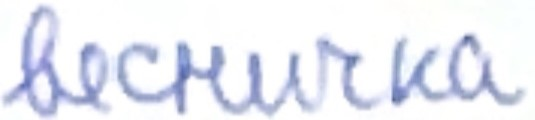весничка
